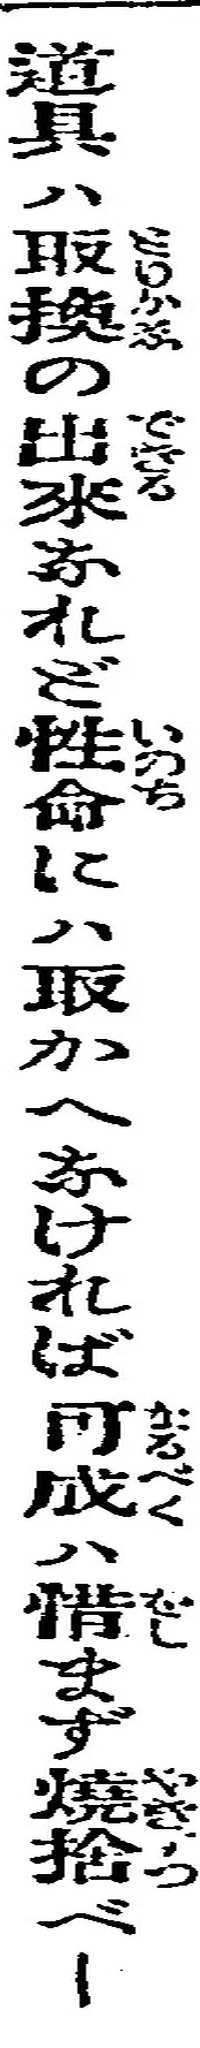道具は取換の出來なれど性命には取りかへなければ可成は惜まず焼捨べし

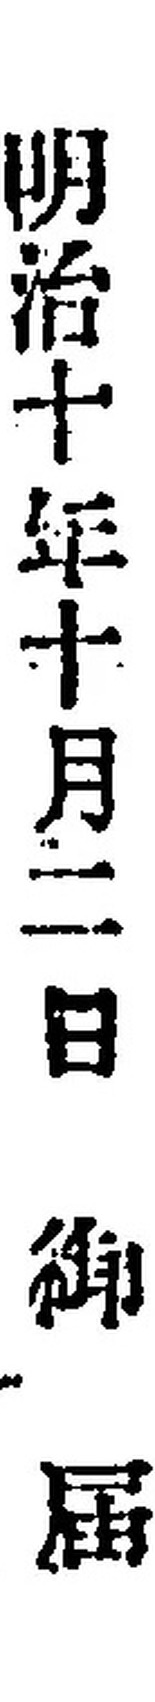明治十年十月二日御届
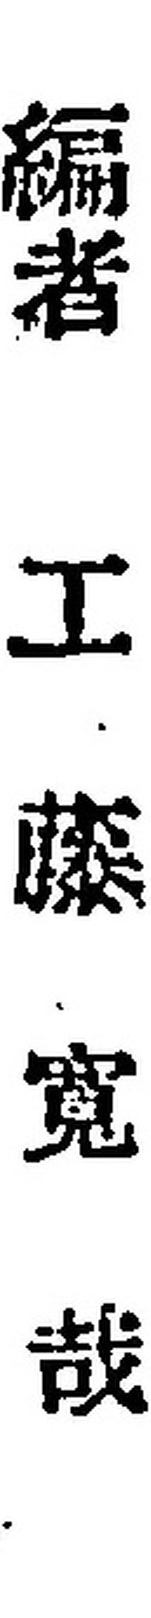編者工藤寛哉
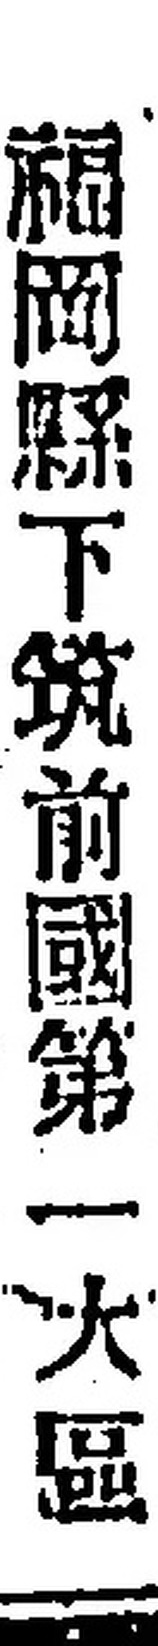福岡縣下筑前國第一大區
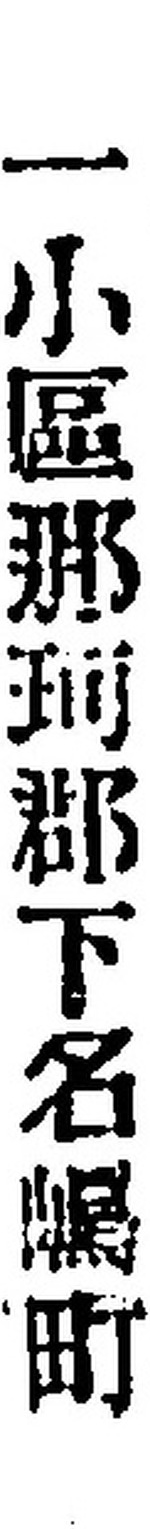一小區那珂郡下名嶋町
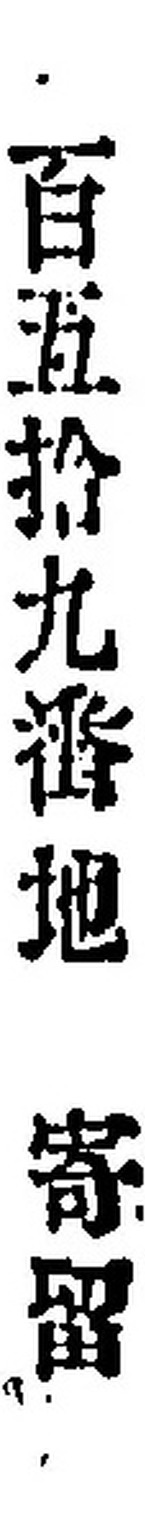百五拾九番地寄留
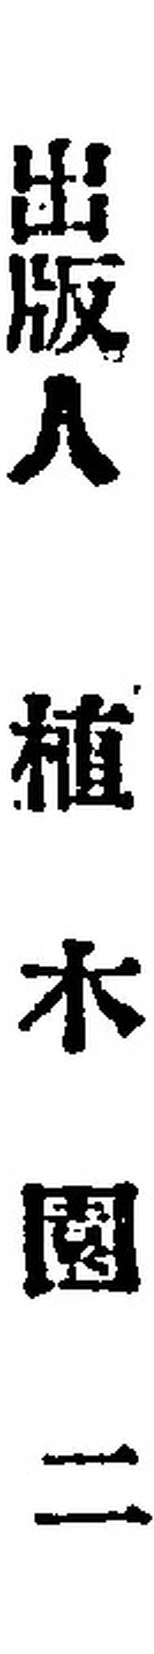出版人植木園二
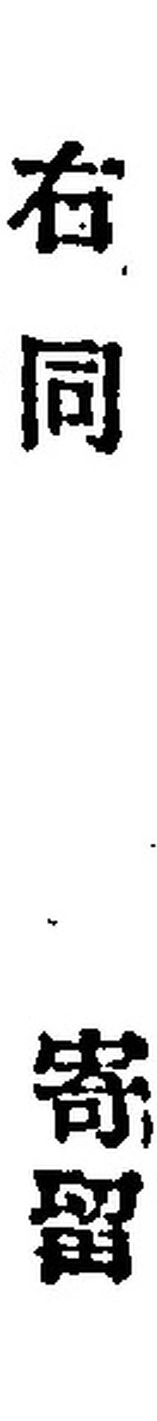右同寄留
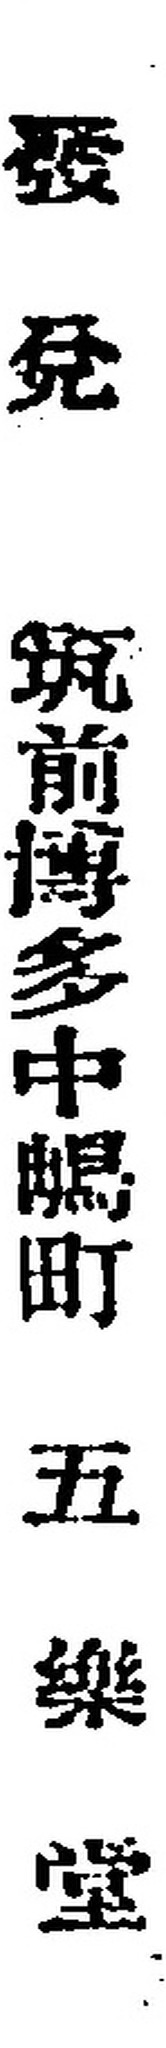發兌筑前博多中嶋町五樂堂
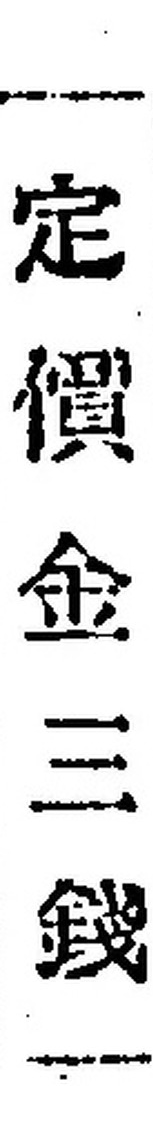定価金三銭
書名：虎列剌病予防養生法訳解
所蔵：国立国会図書館 National Diet Library, JAPAN
